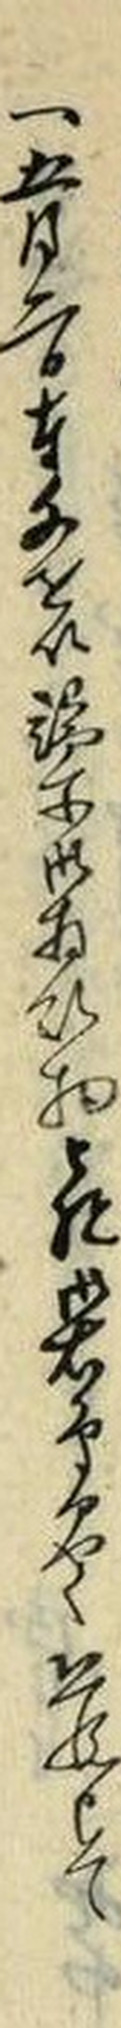一五月二日奉文を以端午御拝領物被遊御右筆部やへ恐悦申上候

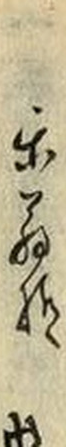楽翁様ゟ
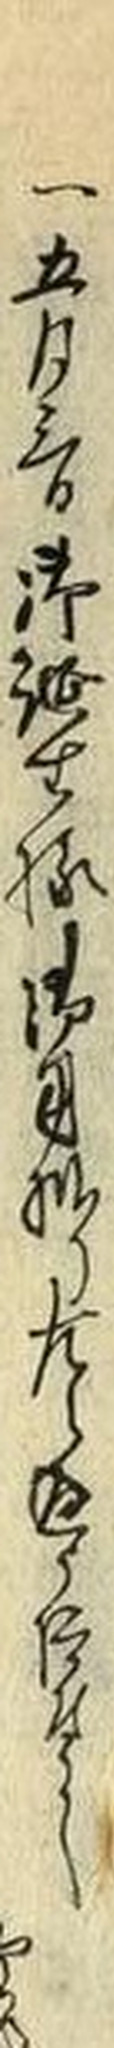一五月三日御誕生様御用掛り左之通被仰仰付之
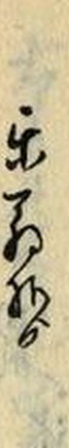楽翁様ゟ
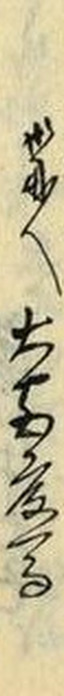御用人大宮藤馬
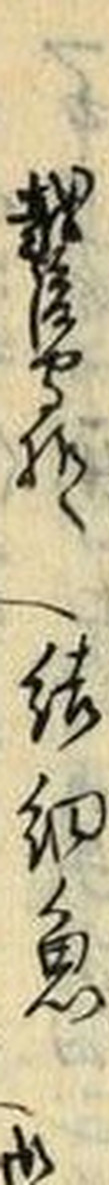越後守様へ結細魚
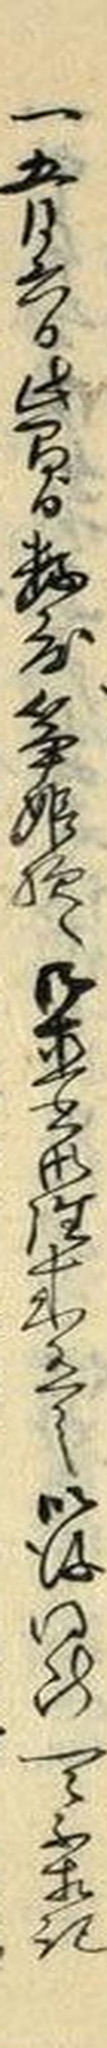一五月六日此間ゟ数度箏姫様へ御直書御往来有之以後同断可被不相記
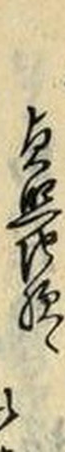貞照院様へ
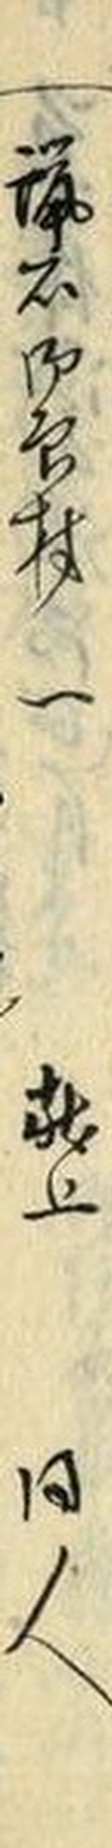蝋石御印材一献上同人
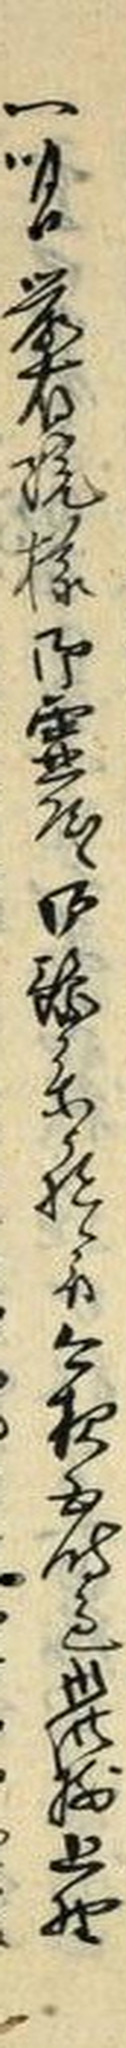一明日厳有院様御霊屋へ御豫参被遊候ニ付今夜五時過御供揃上野
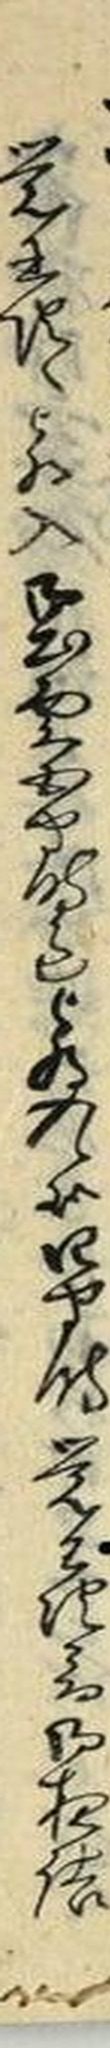覚王院へ被為入御出殿五半時過被為入候処四半時覚王院ニ而御夜詰
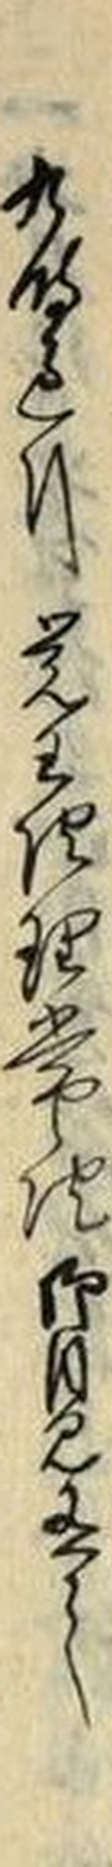九時過引覚王院理常院御目見有之

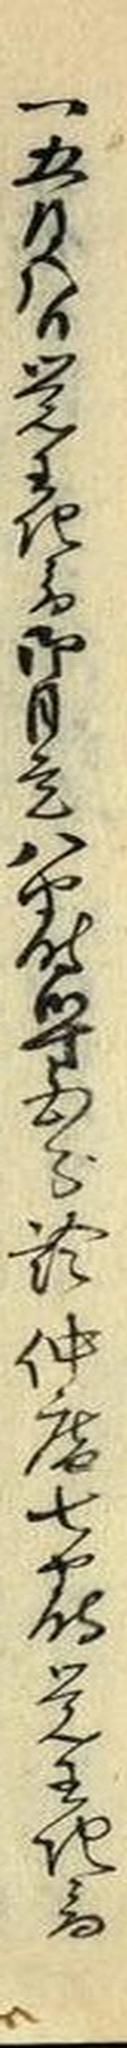一五月八日覚王院ニ而御目覚八半時弐寸五分診仲庵七半時覚王院ニ而
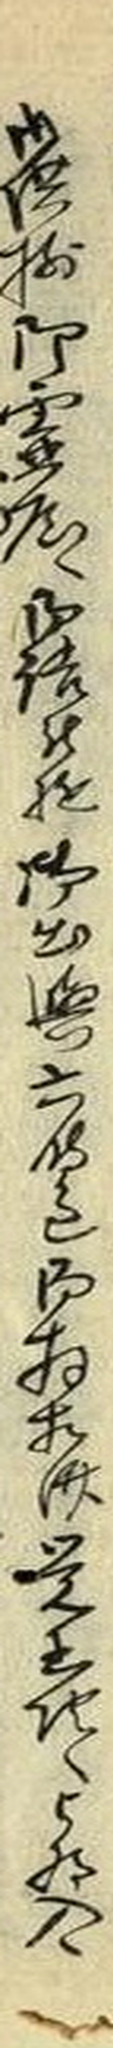御供揃御霊屋へ御詰被遊御出輿六時過御拝相済覚王院へ被為入候
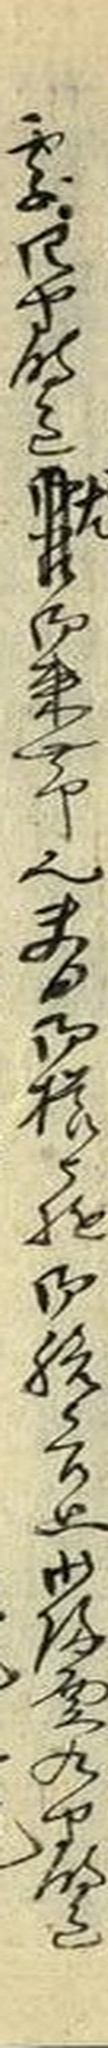処四半時過尤御束帯也夫ゟ御櫛被遊御膳被召上御帰殿九半時過
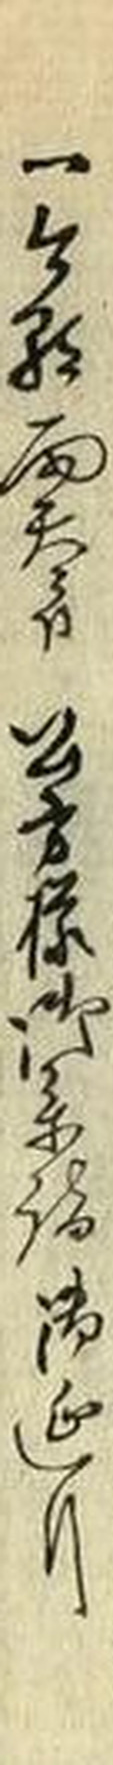一今朝雨天ニ付公方様御参詣御延引
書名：少傅日録抄（斉承付側向頭取日記、在府）
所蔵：福井県文書館 Fukui Prefectural Archives
